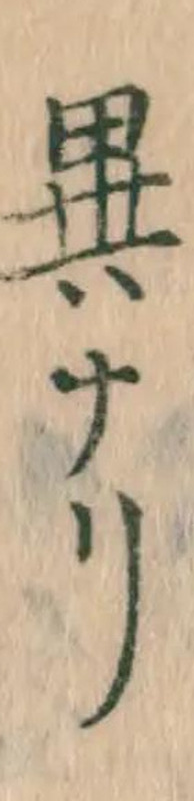異ナリ

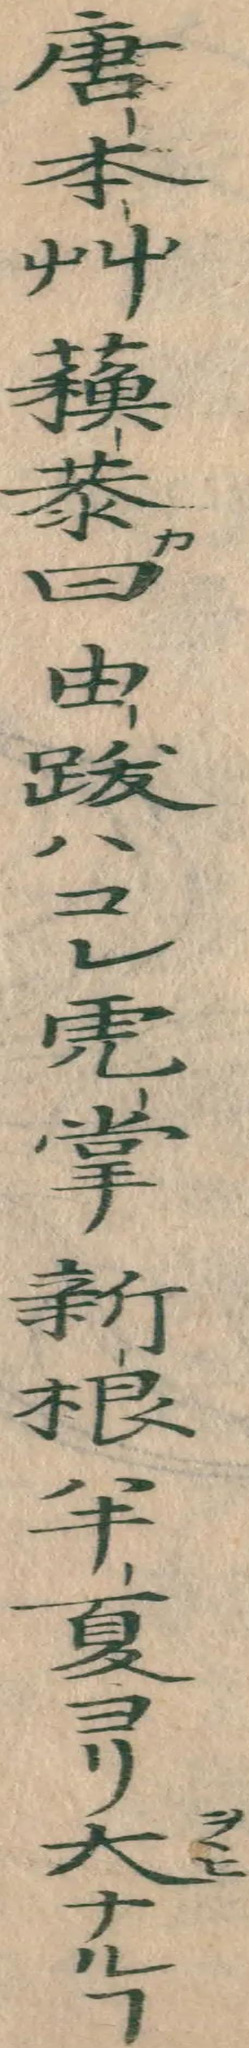唐-本-草蘇-恭曰由-跋ハコレ虎-掌新-根半-夏ヨリ大ナルコト
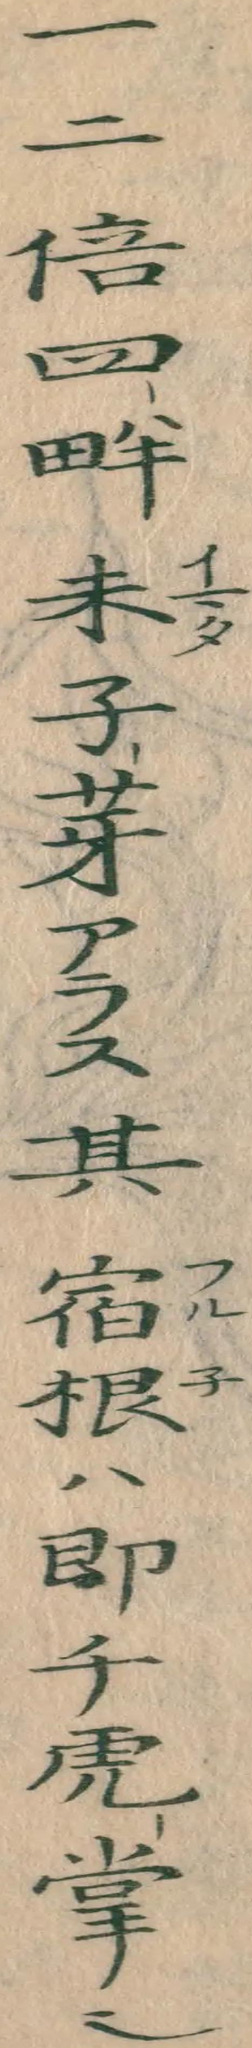一二倍四-畔未子-芽アラス其宿根ハ即チ虎-掌也
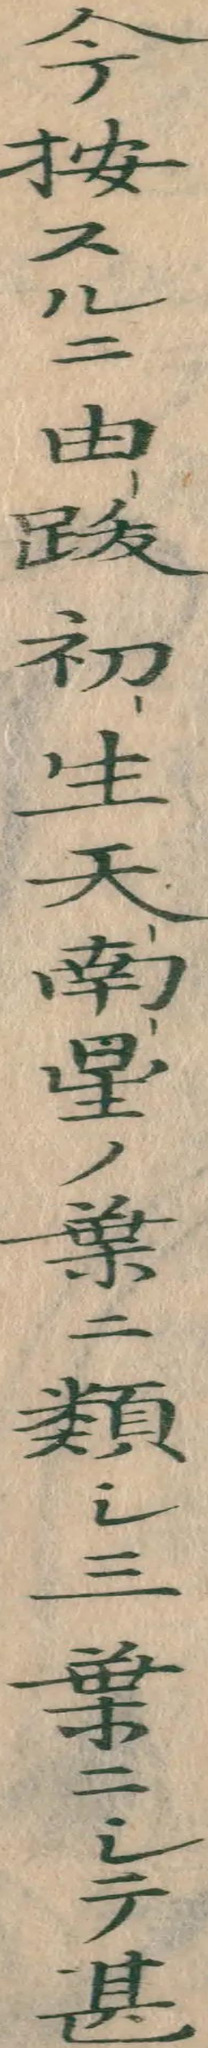今按スルニ由-跋初-生天-南-星ノ葉ニ類シ三葉ニシテ甚
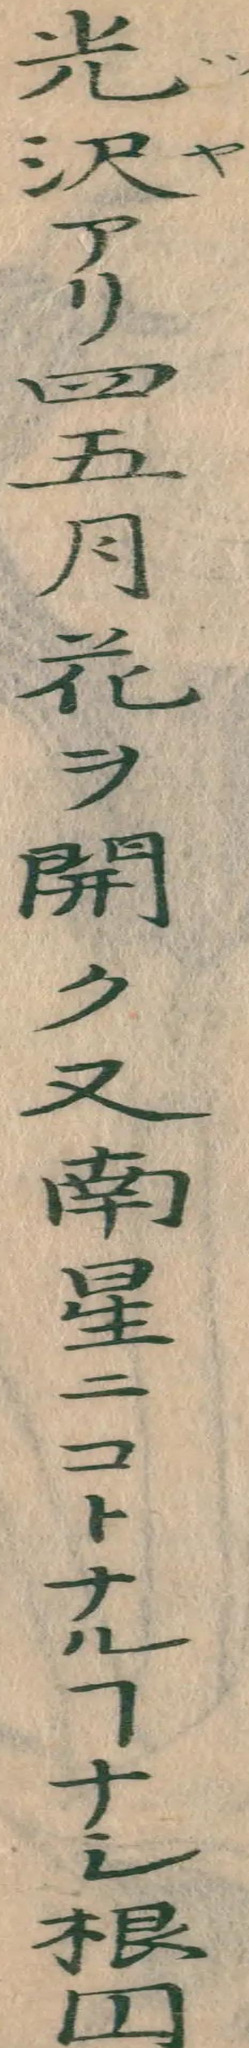光沢アリ四五月花ヲ開ク又南星ニコトナルコトナシ根円
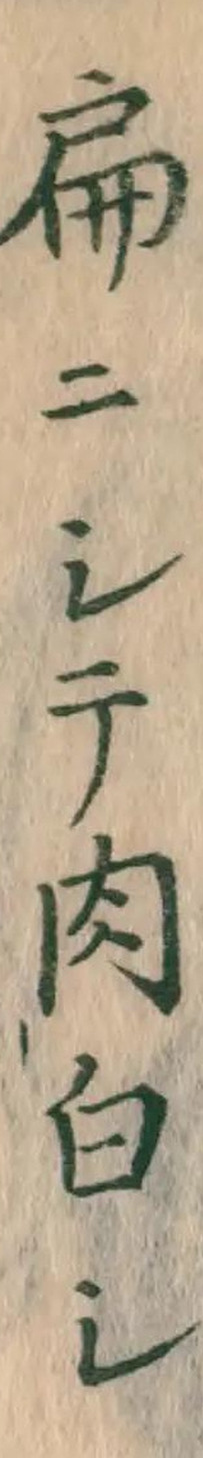扁ニシテ肉-白シ
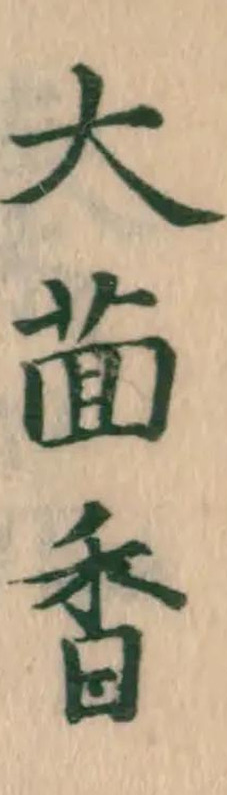大茴香

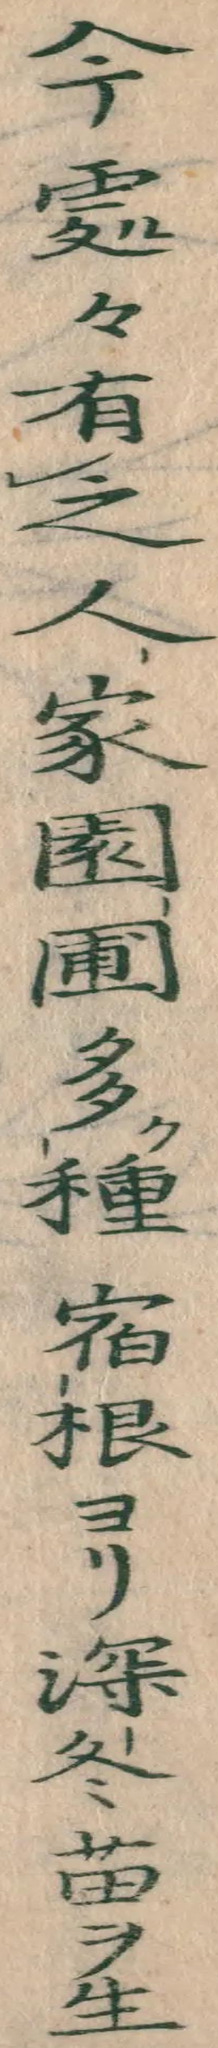今処々有之人-家園-圃多-種宿-根ヨリ深-冬苗ヲ生
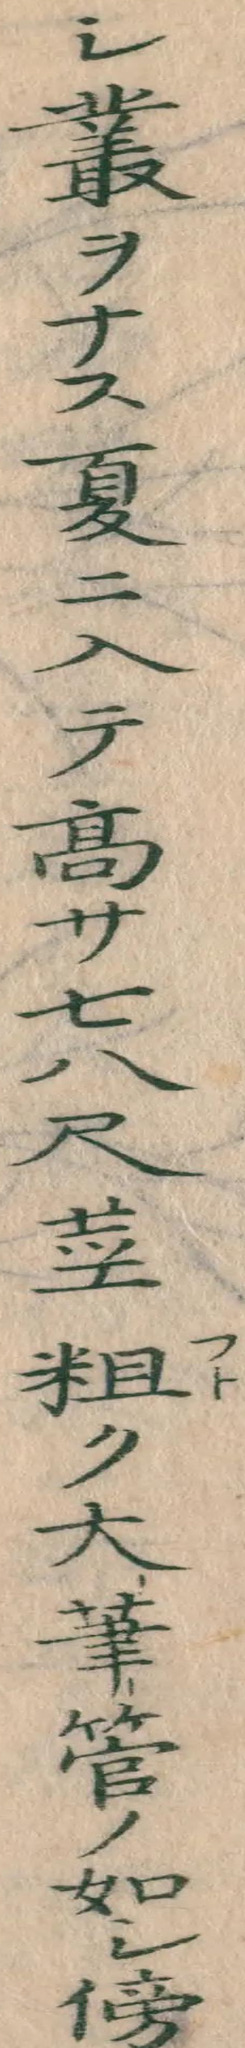シ叢ヲナス夏ニ入テ高サ七八尺茎粗ク大-茟-管ノ如シ傍
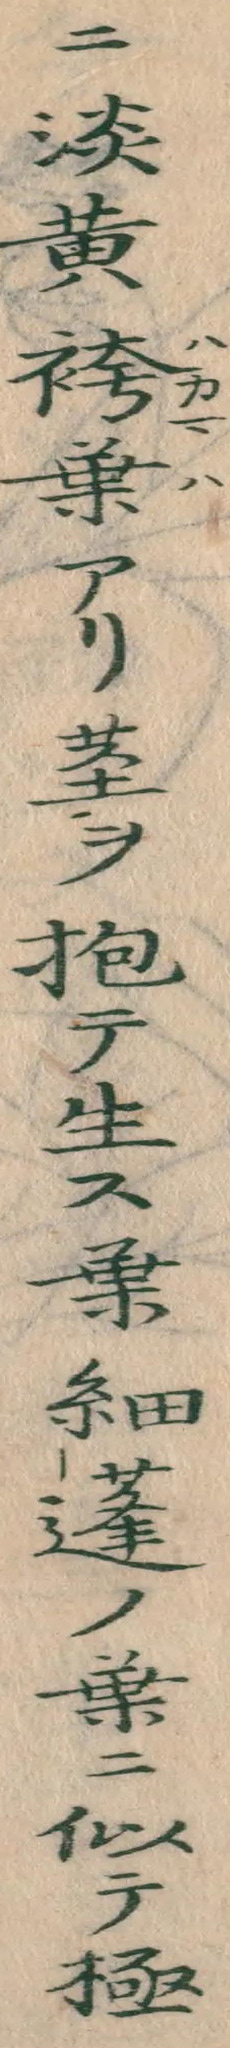ニ淡黄袴葉アリ茎ヲ抱テ生ス葉細-蓬ノ葉ニ似テ極
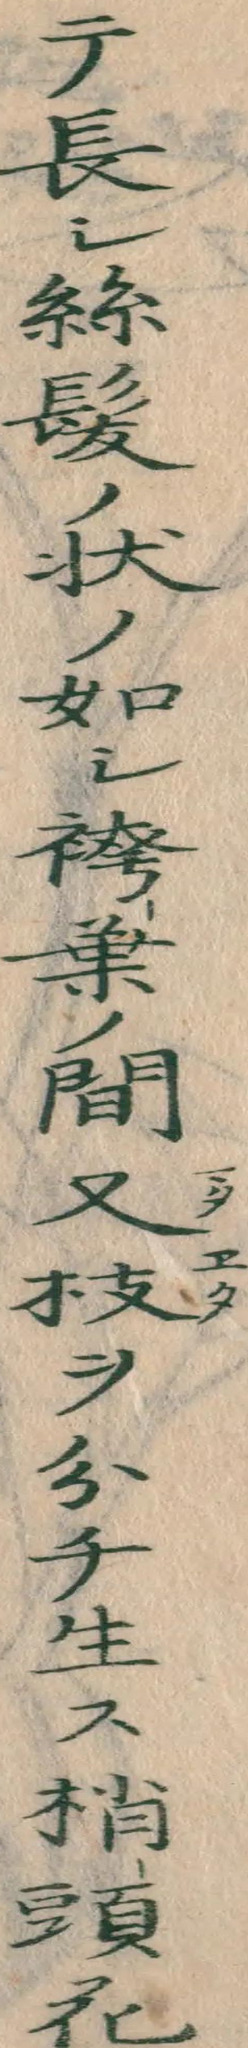テ長シ糸髪ノ状ノ如シ袴-葉ノ間又枝ヲ分チ生ス梢-頭花
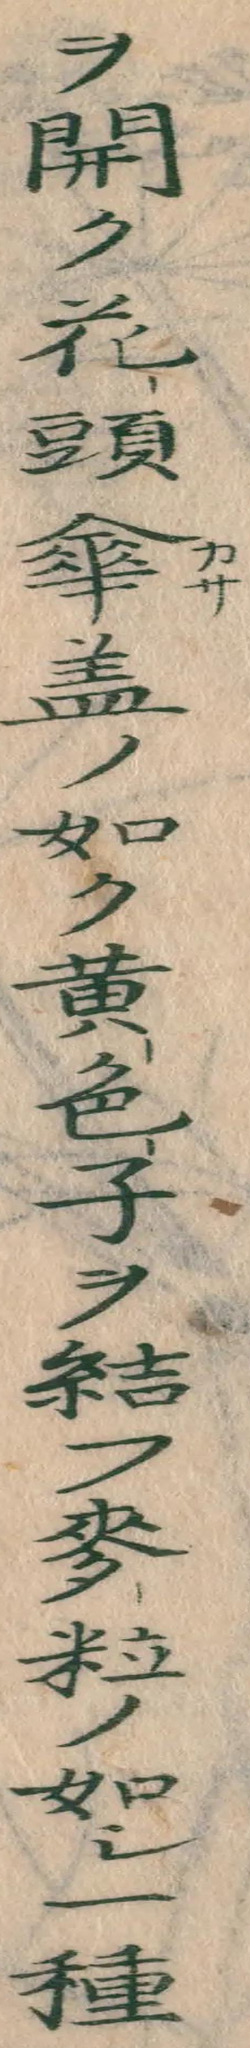ヲ開ク花-頭傘蓋ノ如ク黄-色-子ヲ結フ麦-粒ノ如シ一種
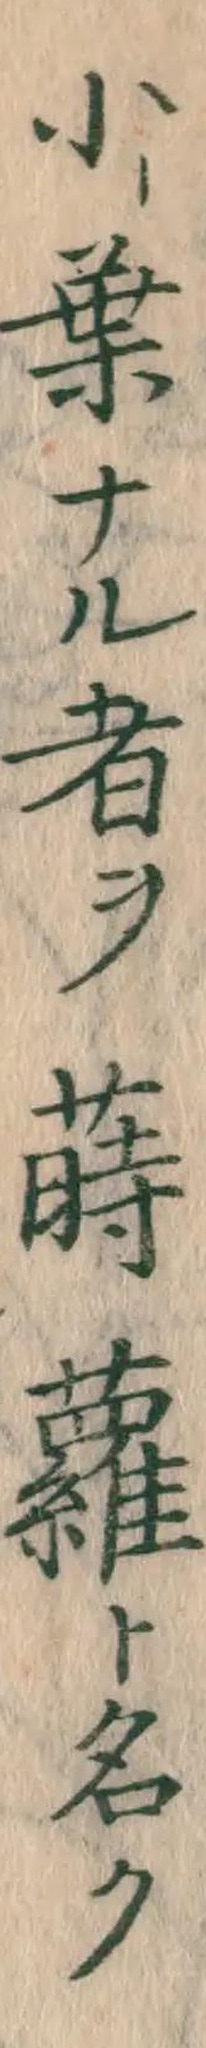小-葉ナル者ヲ蒔蘿ト名ク

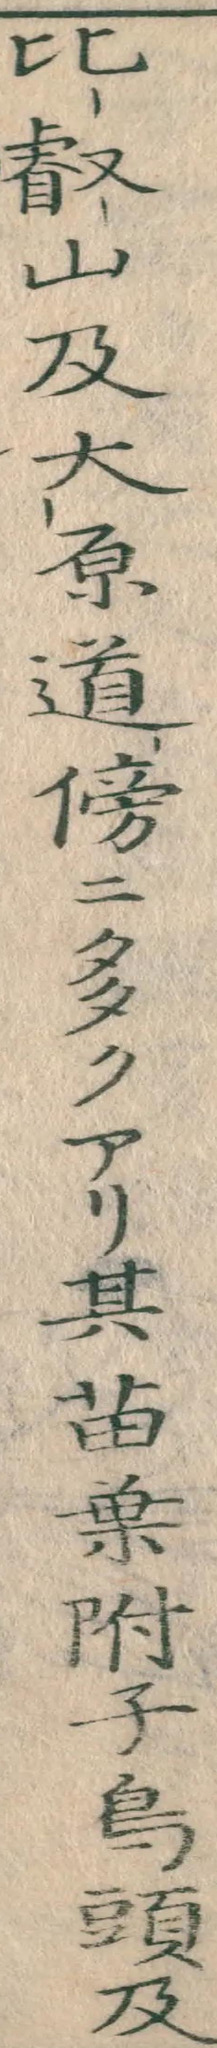比-叡-山及大-原道-傍ニ多クアリ其苗葉附子鳥頭及
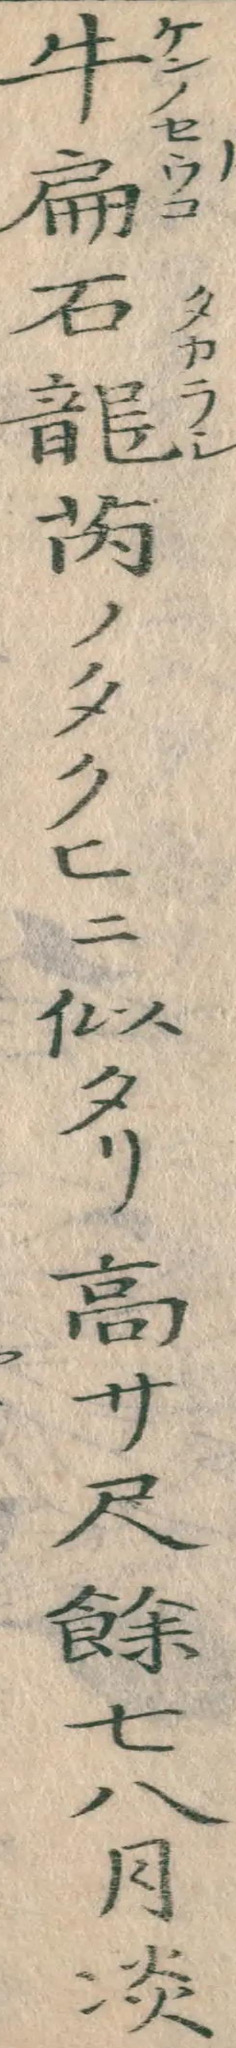牛扁石竜芮ノタクヒニ似タリ高サ尺余七八月淡
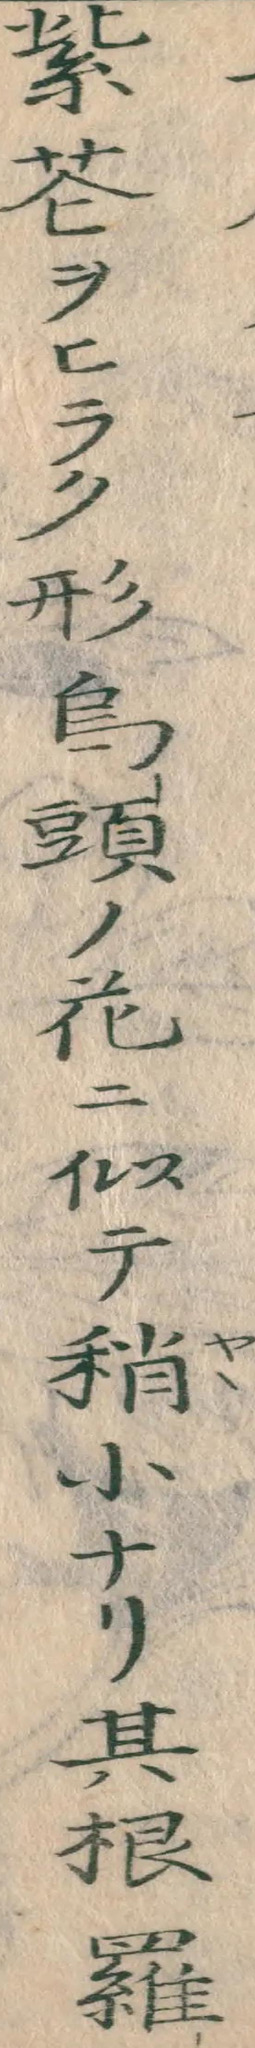紫花ヲヒラク形烏-頭ノ花ニ似テ稍小ナリ其根羅-
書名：花彙 草部4巻木部4巻. [1]
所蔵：国立国会図書館 National Diet Library, JAPAN
